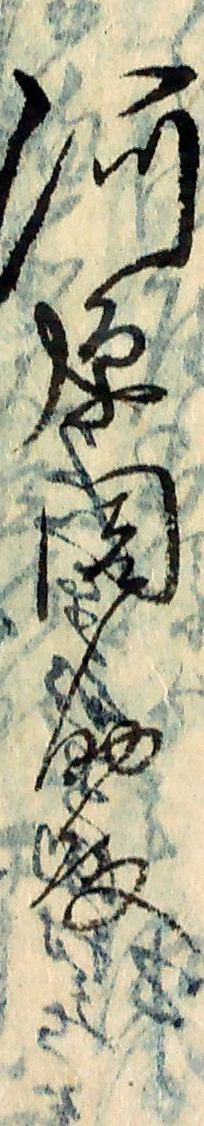河原周助殿
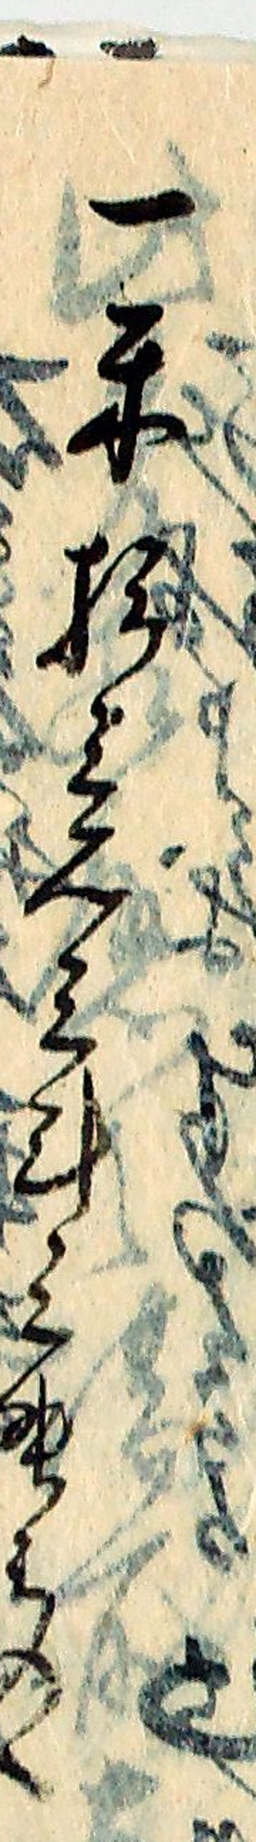一米拾三石三斗三升三合
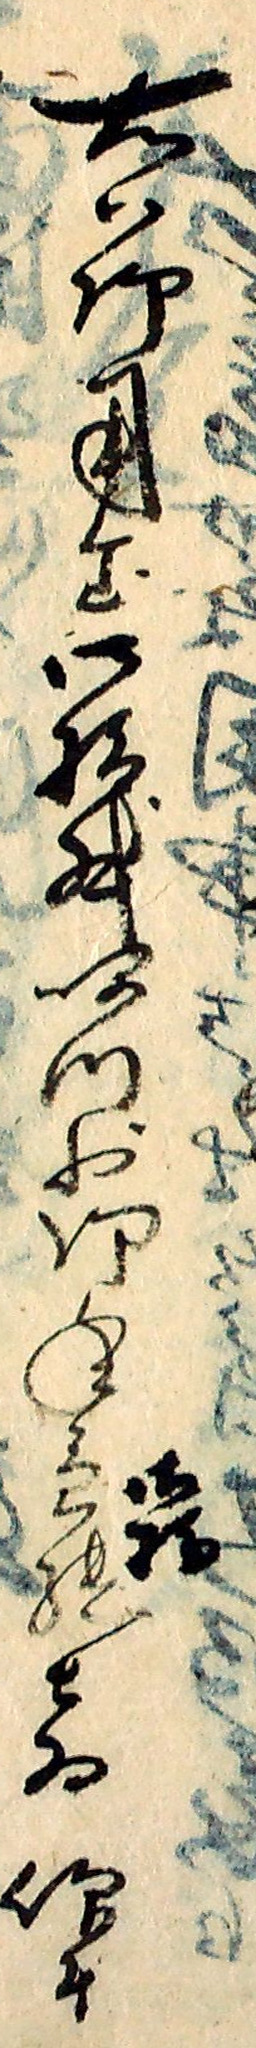右御用金御指紙早淵村御年貢御指継被為仰付
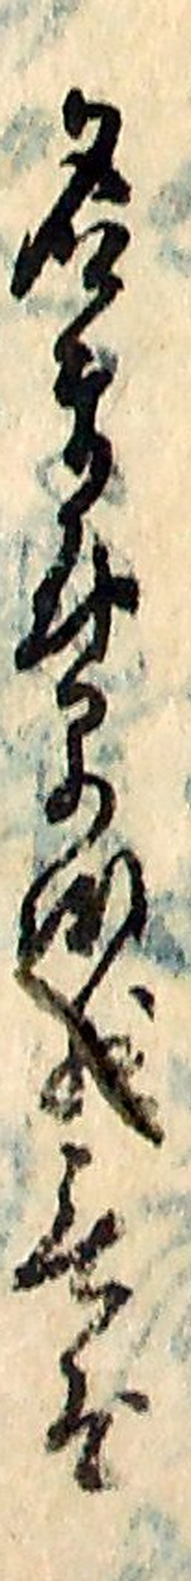名東郡早淵村庄屋
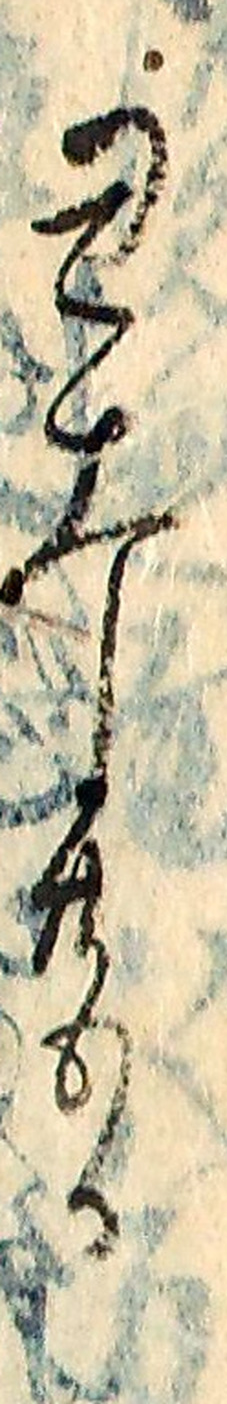丑十一月廿二日
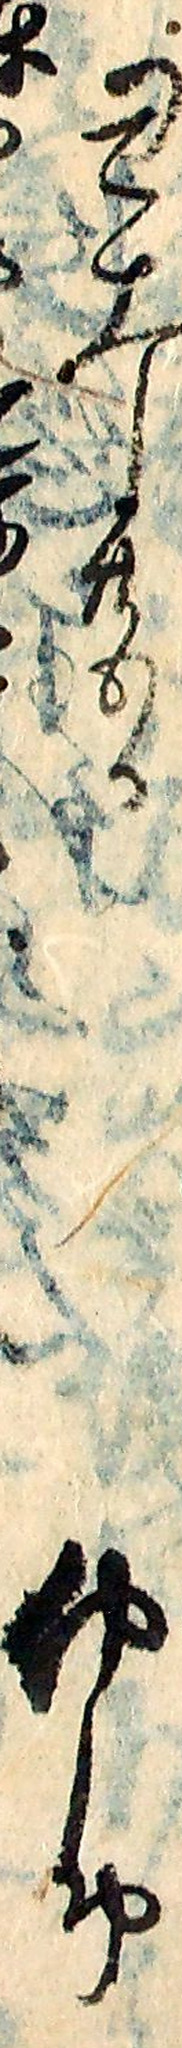丑十一月廿五日仲助
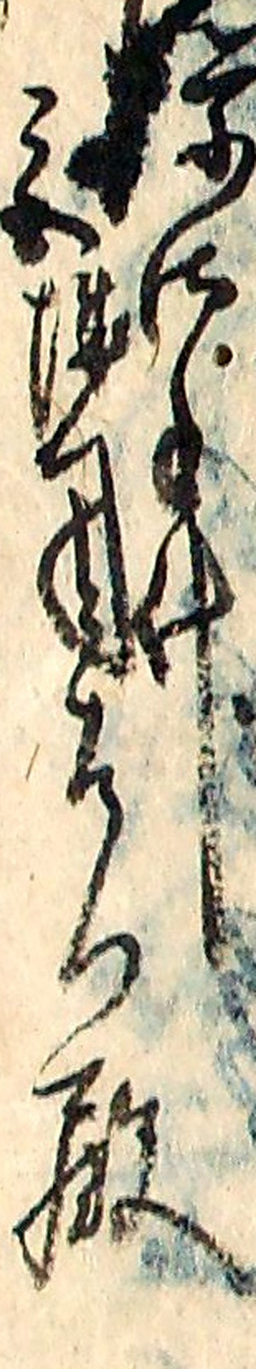宮城周右衛門殿

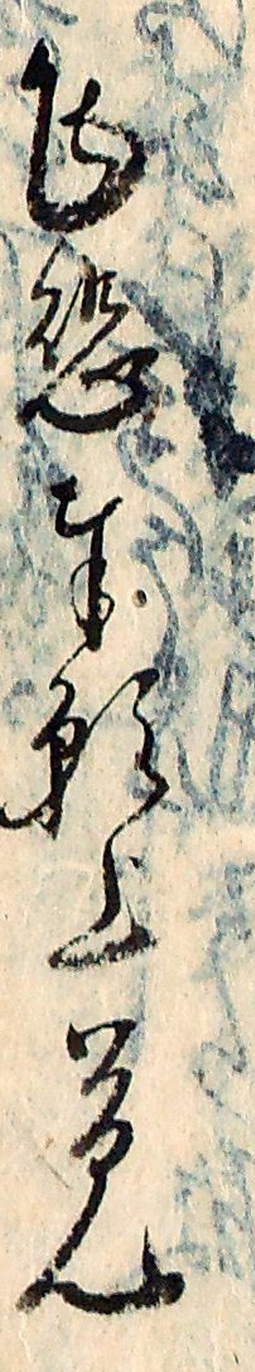乍恐奉願上覚
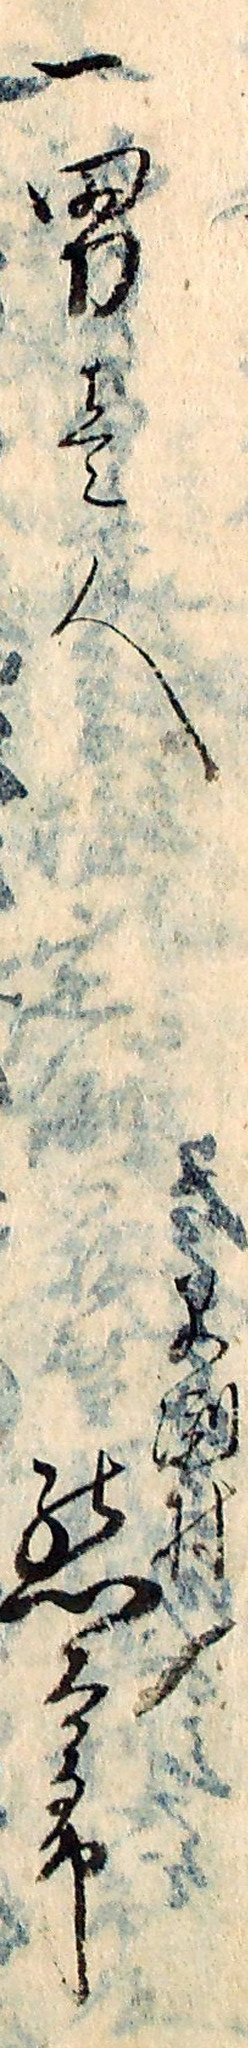一男壱人熊太郎
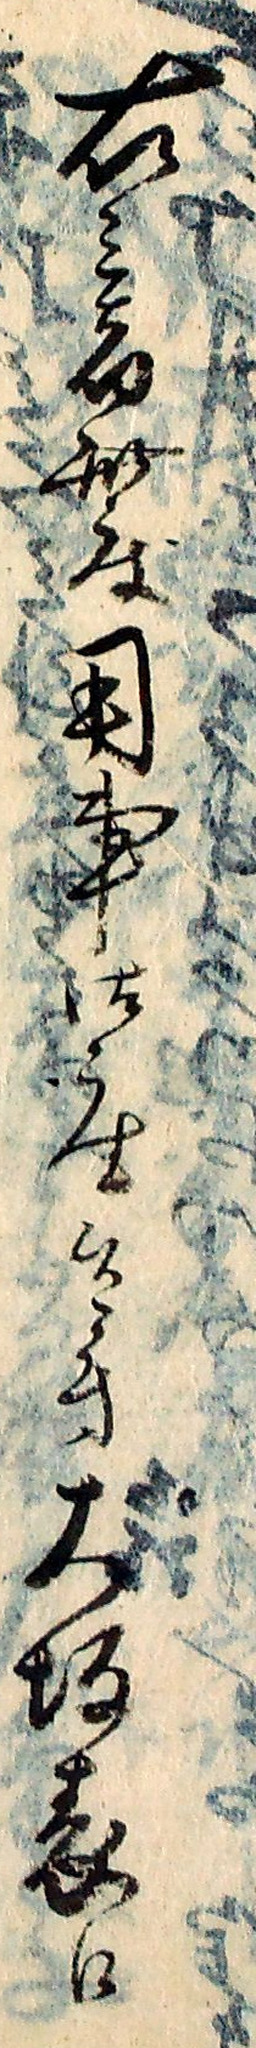右之者此度用事御座候に付大坂表え
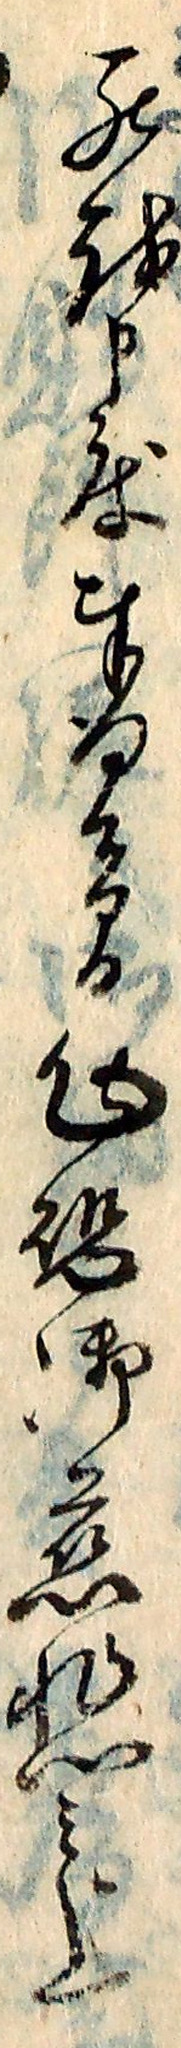罷越申度奉存候間乍恐御慈悲之上
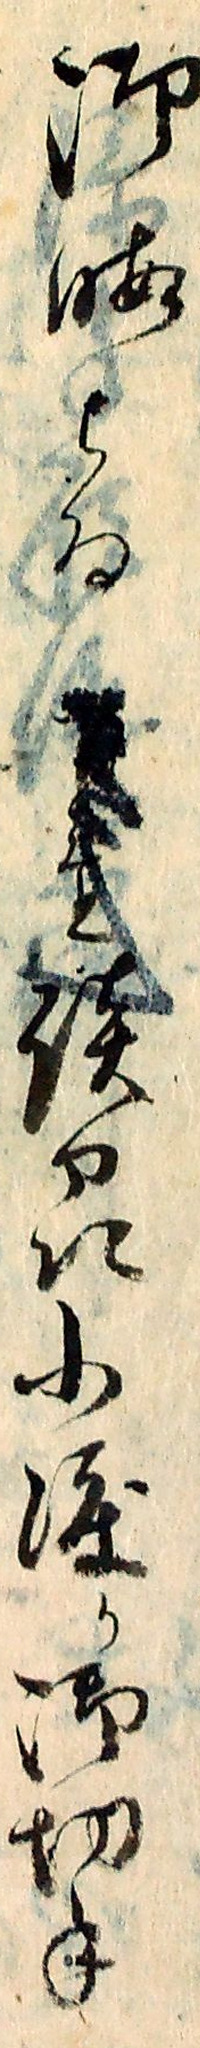御暇被為下置淡州小渡り御切手
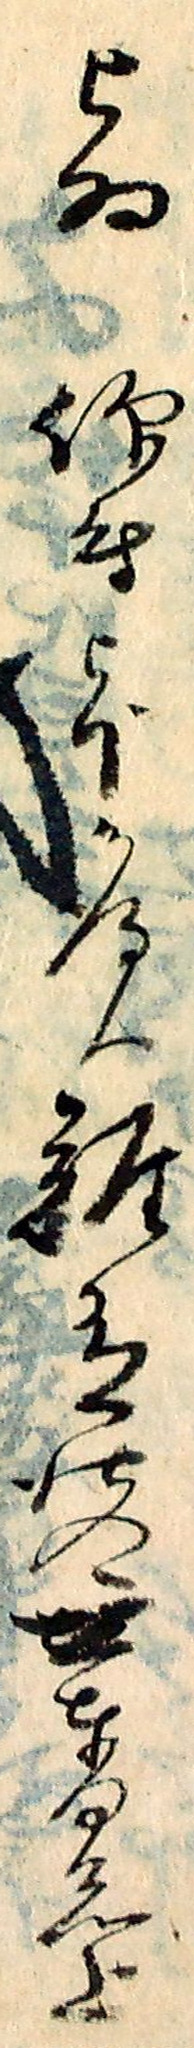被為仰付被下候得は難有仕合可奉存候以上
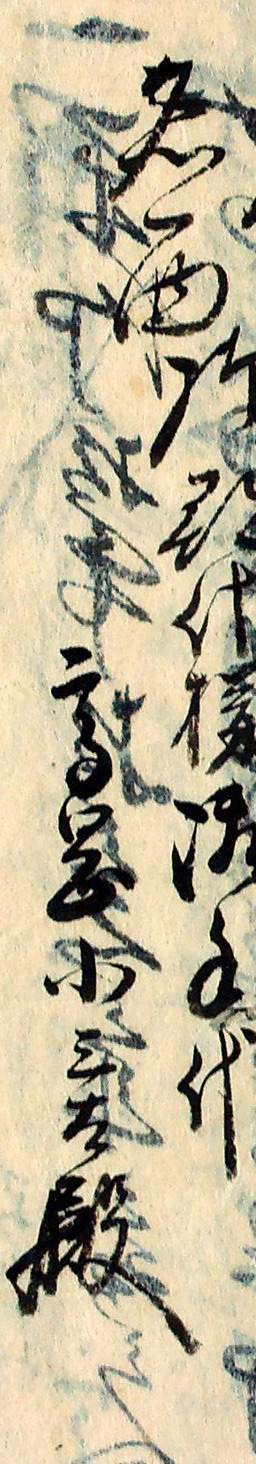高岡小三太殿
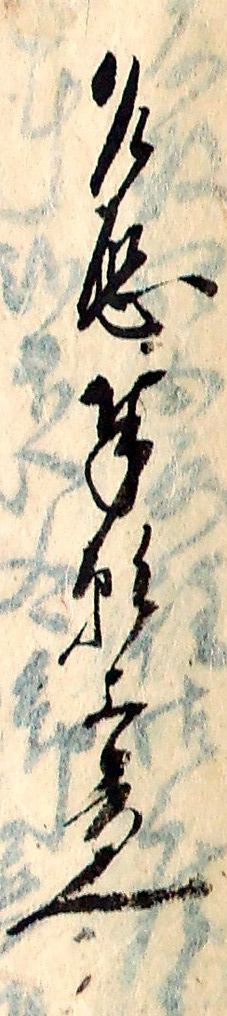乍恐奉願上覚

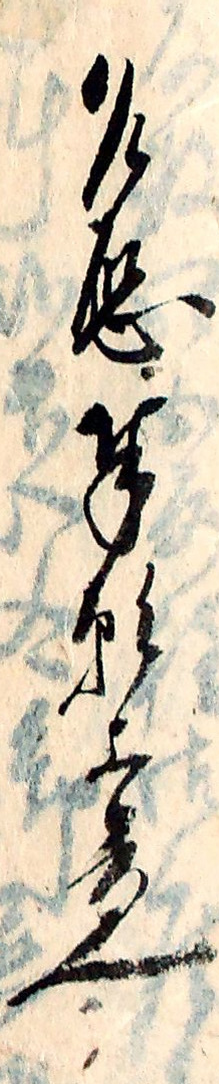乍恐奉願上覚
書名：諸御願書控(後藤氏壱番）
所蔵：鳴門教育大学 Naruto University of Education
